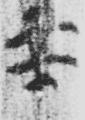不
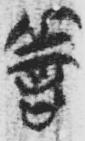善
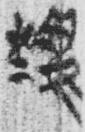埶（势）
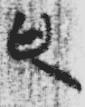也
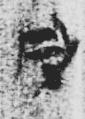凡
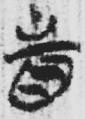眚（性）
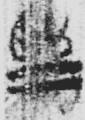爲
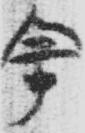宔（主）
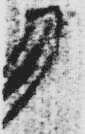勿（物）
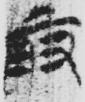取
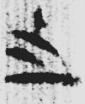之
